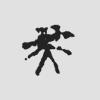天
